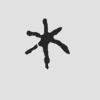木
